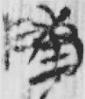○（陳）
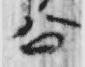公
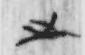之
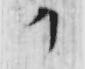人
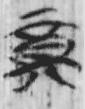奠
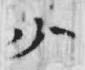少
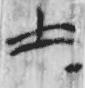士
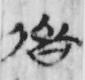俈
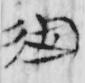○（卜）
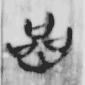嵒
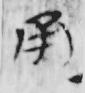甬
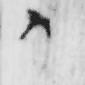人
